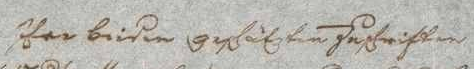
Ihre beiden geschätzten Zuschriften/
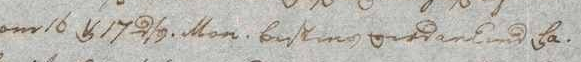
vom 16 & 17 dss. Mon. bestens verdankend ha-
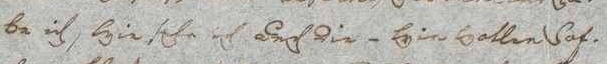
be ich, wie sehr ich auch die – wir wollen hof-
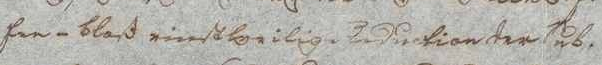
fen – bloß einstweilige Reduction der Sub-
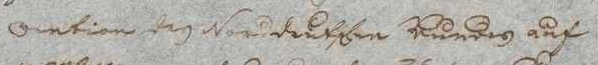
vention des Norddeutschen Bundes auf
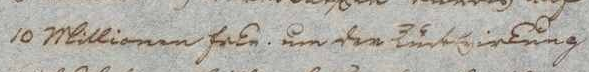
10 Millionen Frkn. um der Rückwirkung
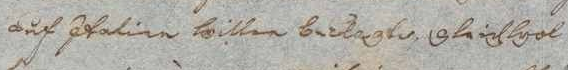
auf Italien willen beklagte, gleichwol
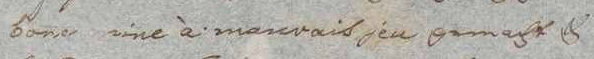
bonne mine à mauvais jeu gemacht &
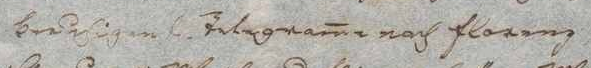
beruhigende Telegramme nach Florenz
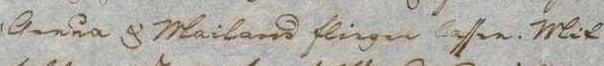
Genua & Mailand fliegen lassen. Mit
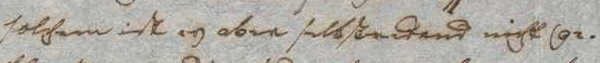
solchem ist es aber selbstredend nicht ge-
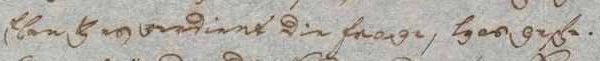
than & es verdient die Frage, was gesche-
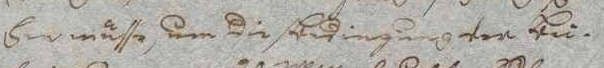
hen müsse, um die Bedingung der Bei-
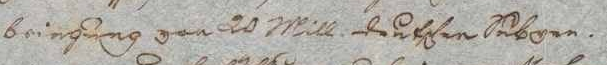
bringung von 20 Mill. deutschen Subven-
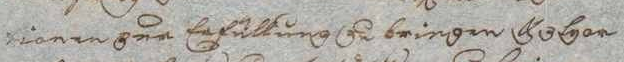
tionen zur Erfüllung zu bringen & zwar
